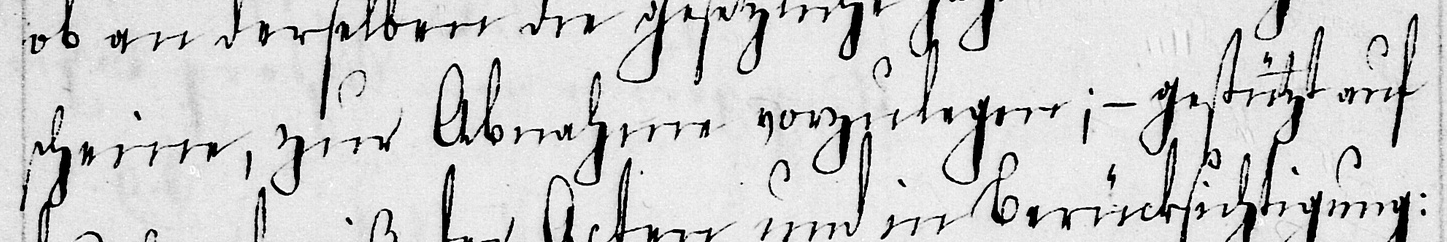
scheine, zur Abnahme vorzulegen; – gestützt auf
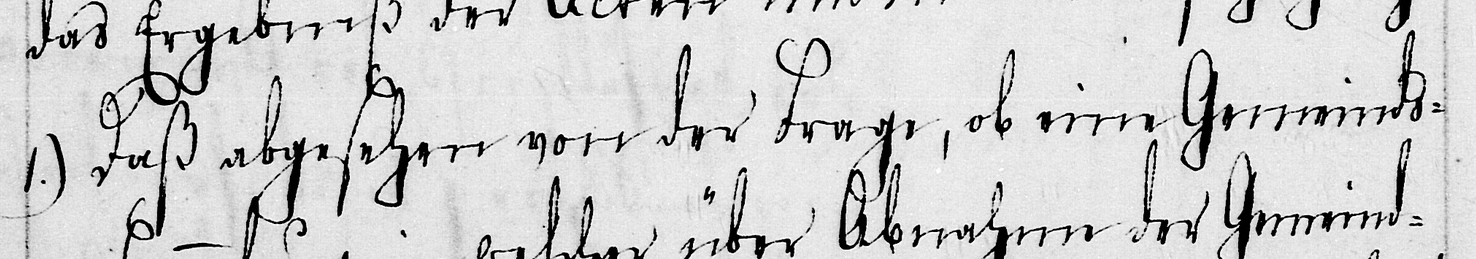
1.) Daß abgesehen von der Frage, ob eine Gemeinds¬
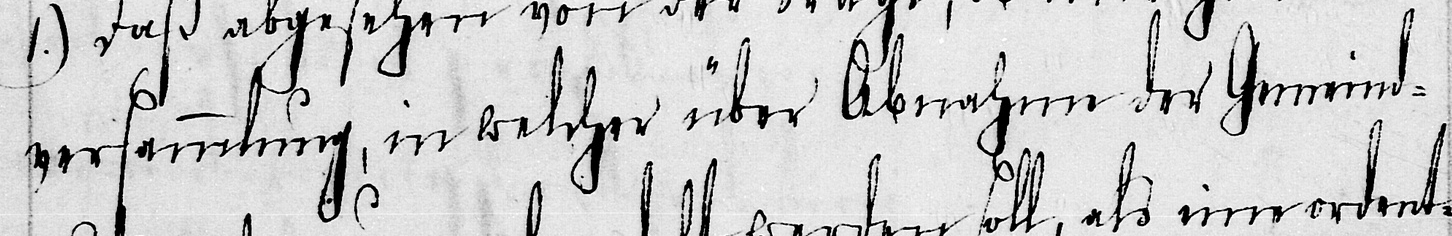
versammlung, in welcher über Abnahme der Gemeind¬
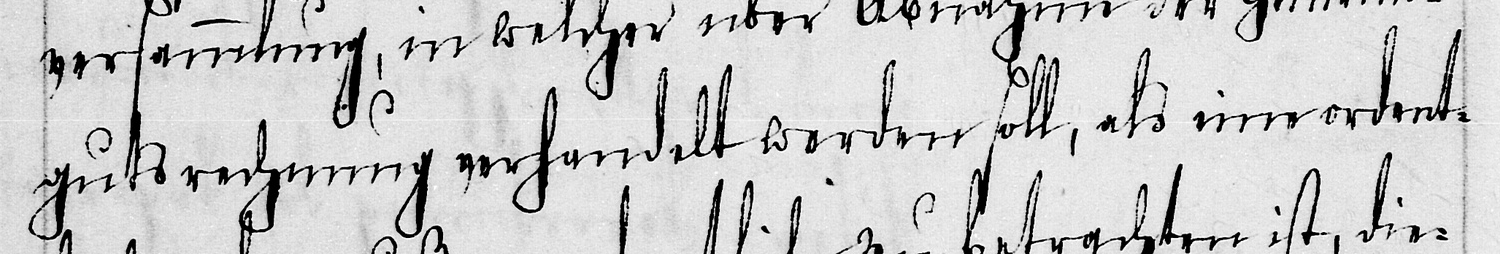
gutsrechnung verhandelt werden soll, als eine ordent¬
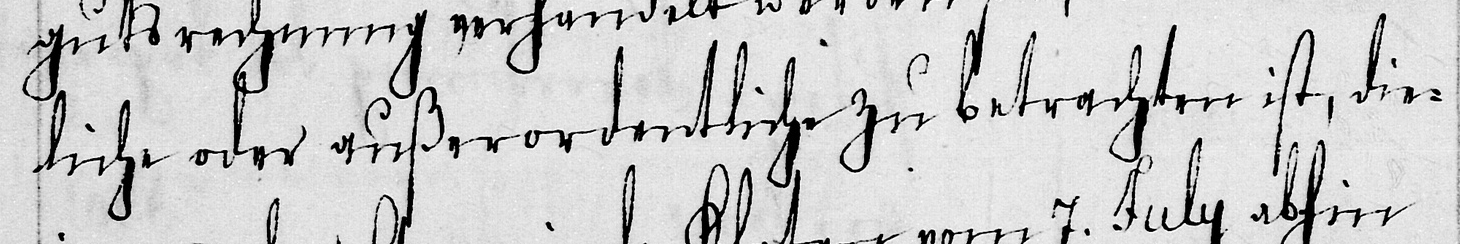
liche oder außerordentliche zu betrachten ist, die¬
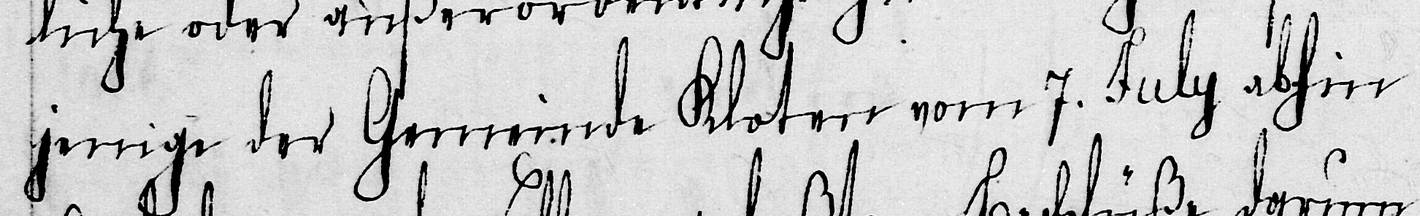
jenige der Gemeinde Kloten vom 7. July abhin
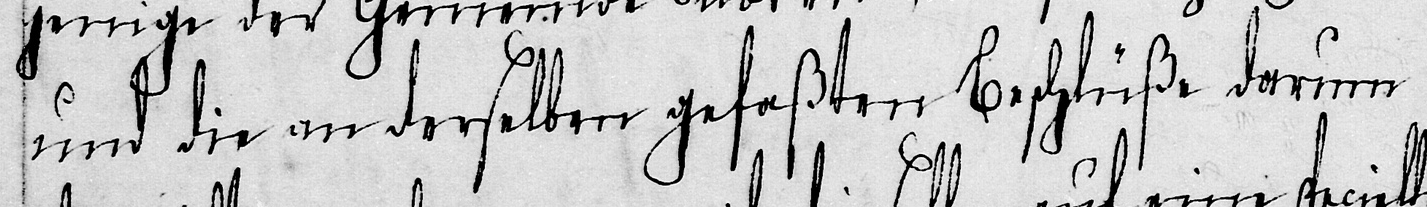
und die an derselben gefaßten Beschlüße darum
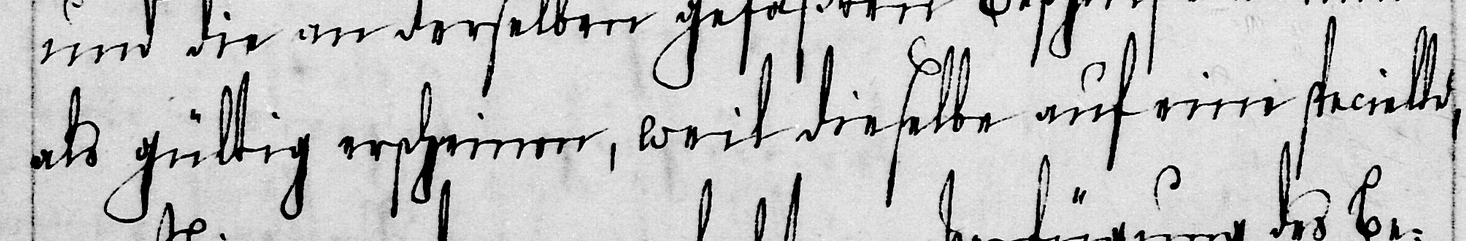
als gültig erscheinen, weil dieselbe auf eine speciel¬
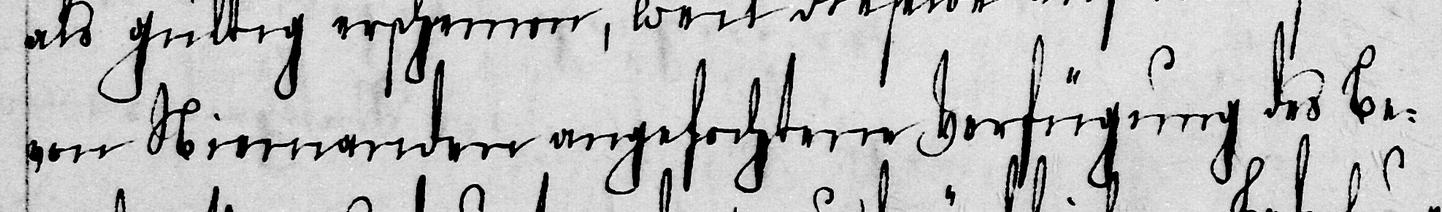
von Niemanden angefochtene Verfügung des Be¬
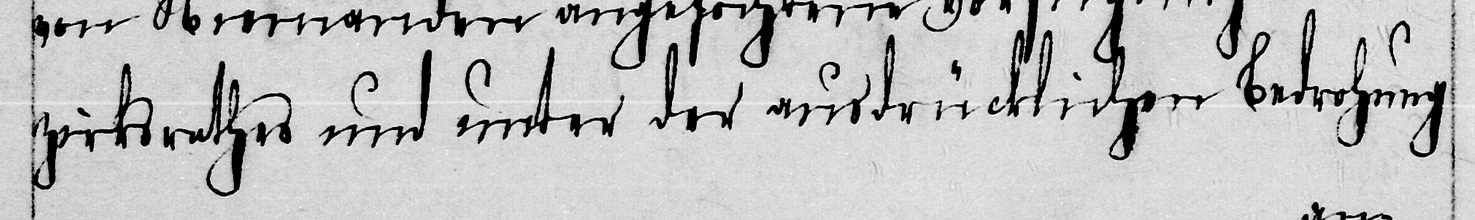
zirksrathes und unter der ausdrücklichen Bedrohung
